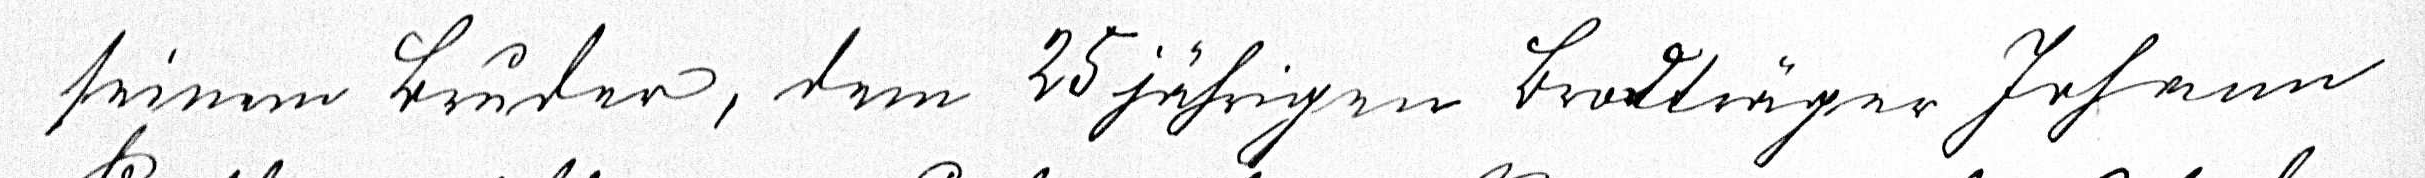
seinem Bruder, dem 25jährigen Brodträger Johann
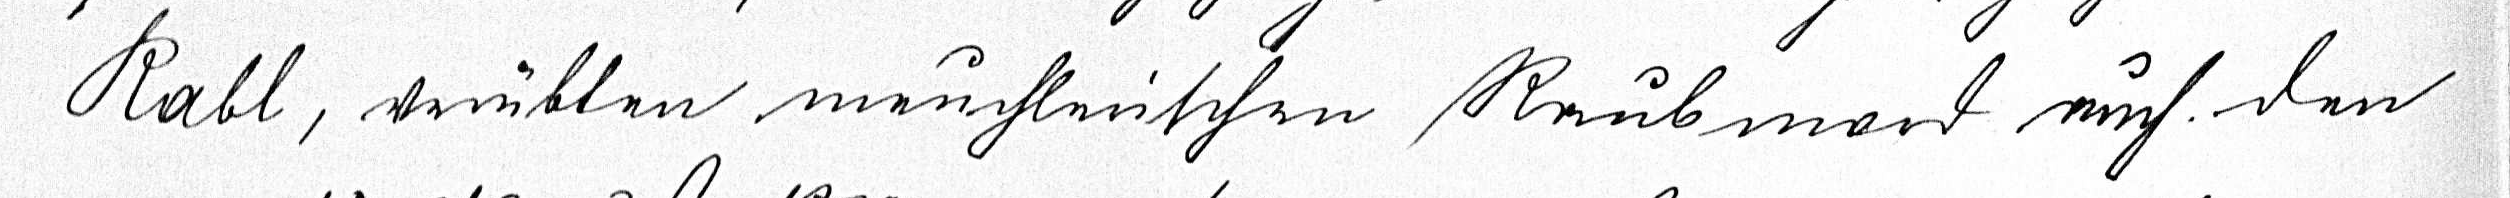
Rabl, verübten meuchlerischen Raubmord auch den
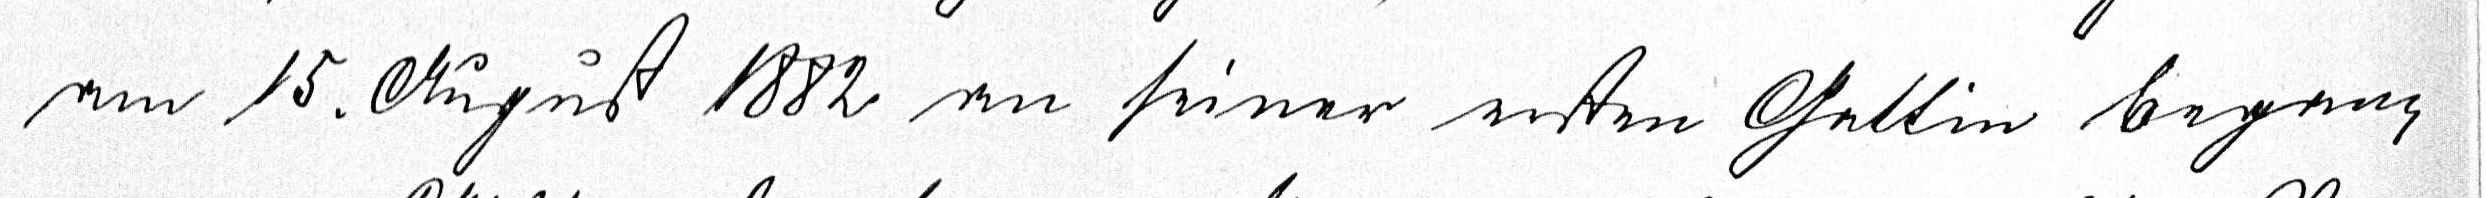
am 15. August 1882 an seiner ersten Gattin began¬
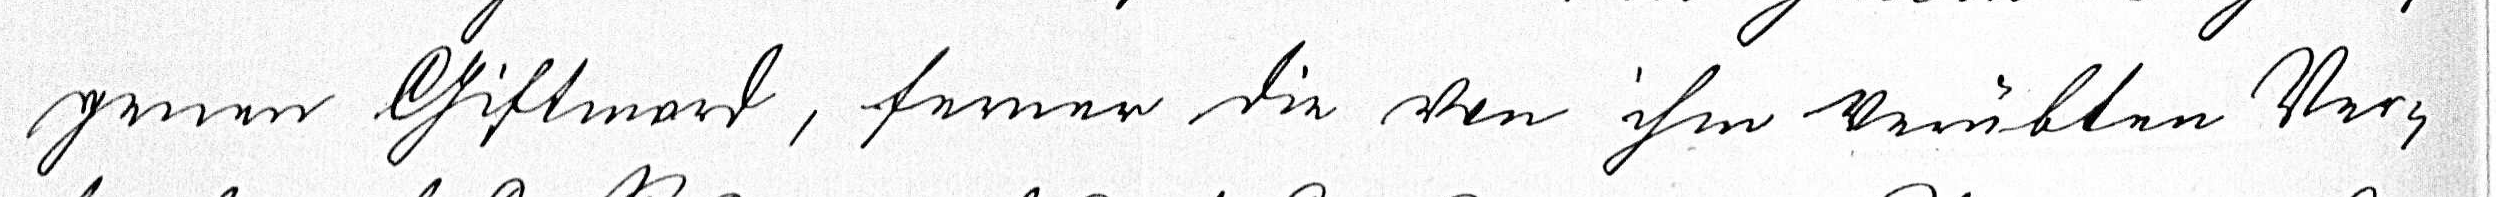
genen Giftmord, ferner die von ihm verübten Ver¬
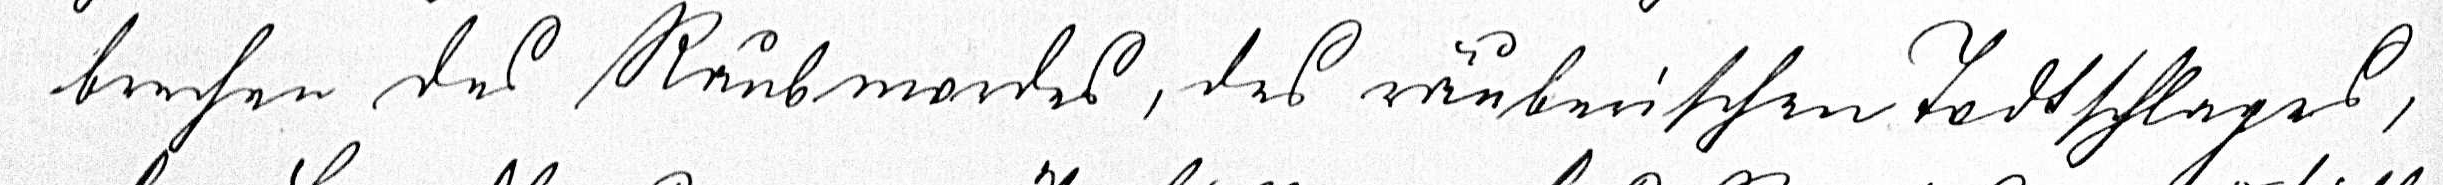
brechen des Raubmordes, des räuberischen Todtschlages,
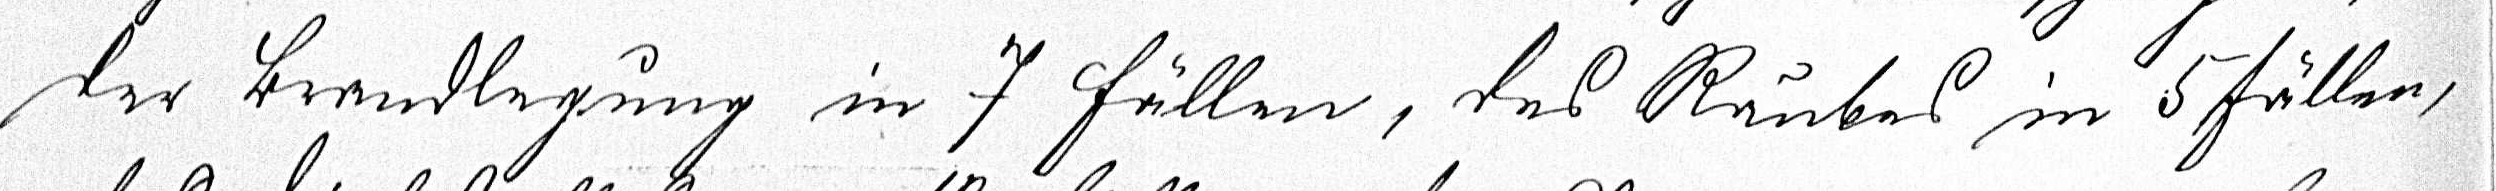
der Brandlegung in 7 Fällen, des Raubes in 5 Fällen,
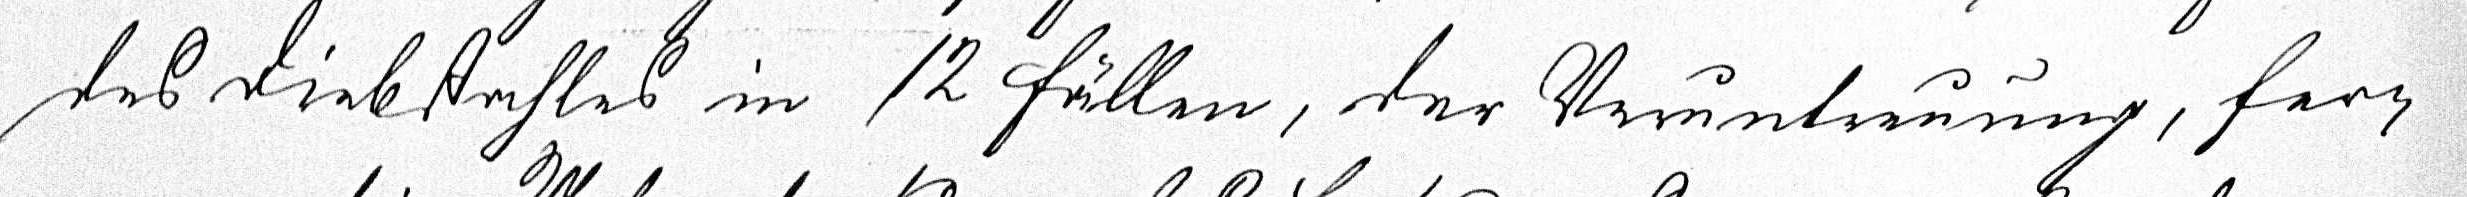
des Diebstahles in 12 Fällen, der Veruntreuung, fer¬
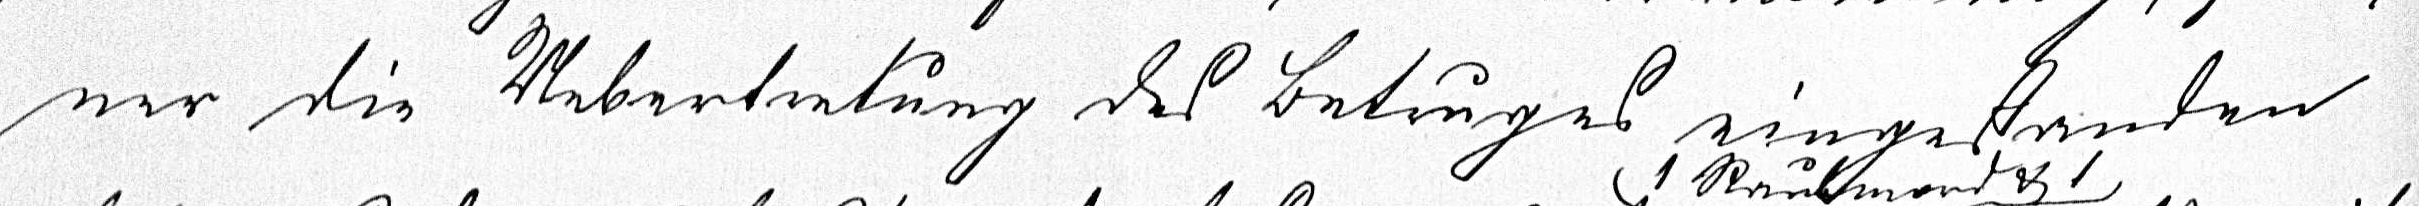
ner die Uebertretung des Betruges eingestanden
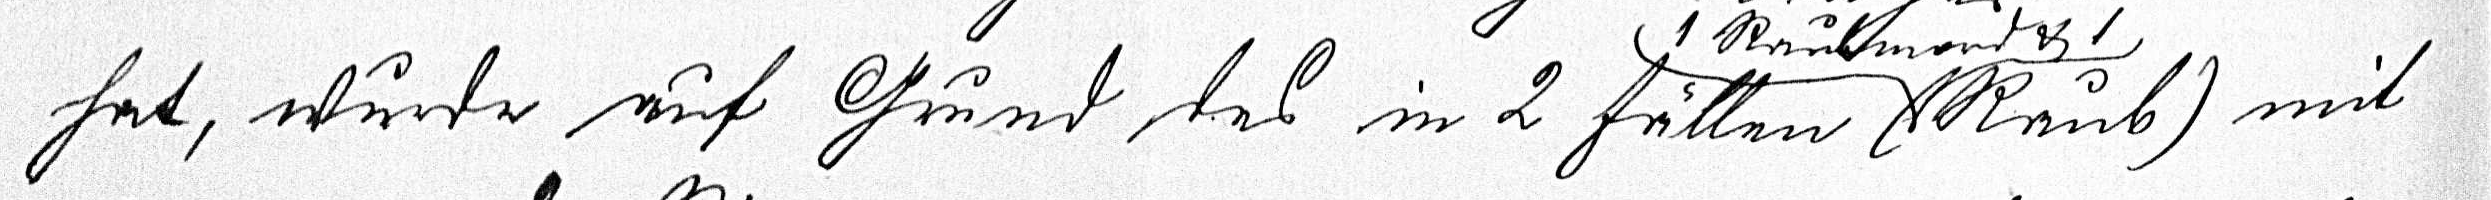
hat, wurde auf Grund des in 2 Fällen (1 Raubmord & 1 Raub) mit
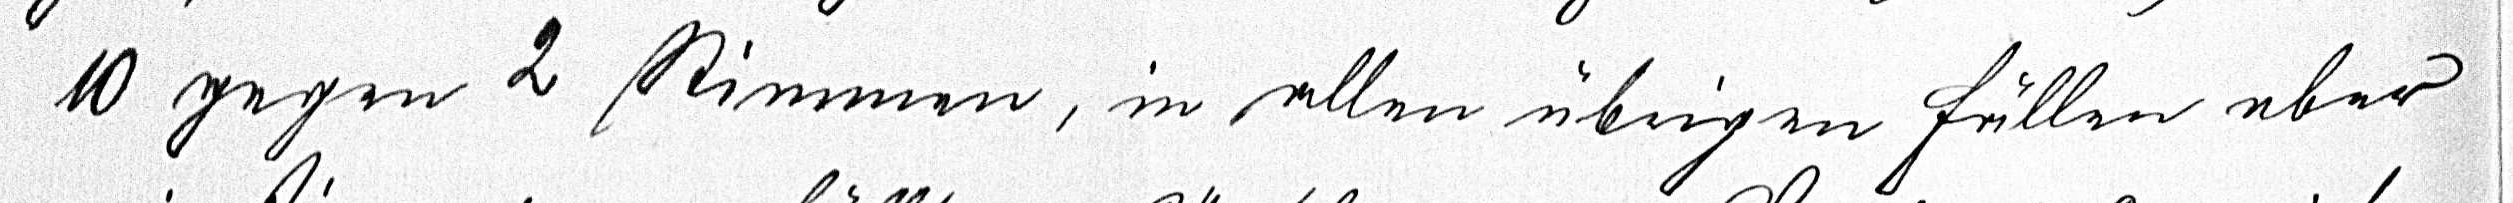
10 gegen 2 Stimmen, in allen übrigen Fällen xxber
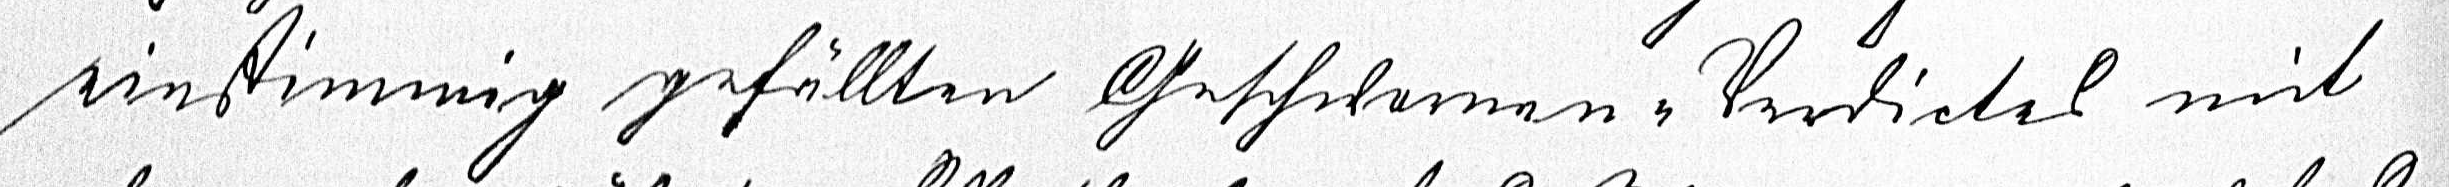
einstimmig gefällten Geschwornen=Verdictes mit
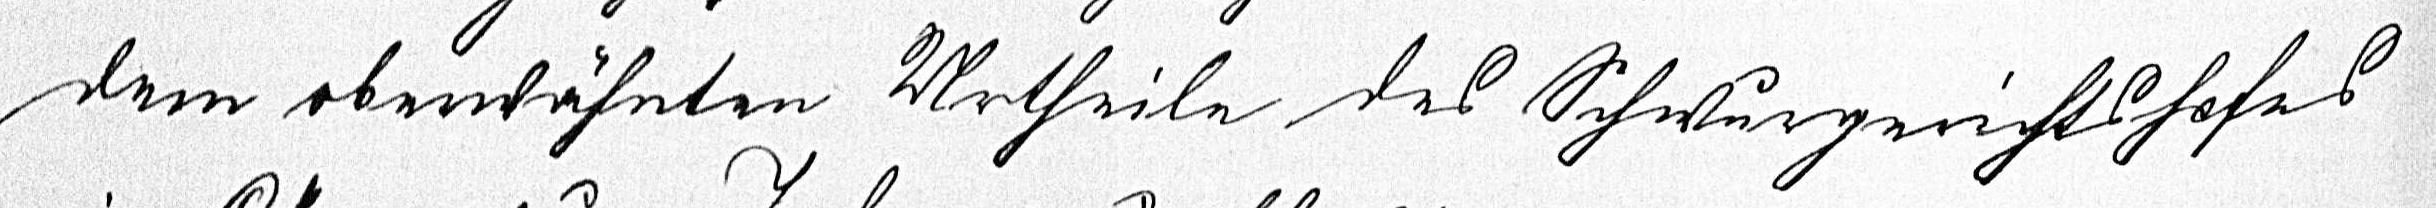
dem oberwähnten Urtheile des Schwurgerichtshofes
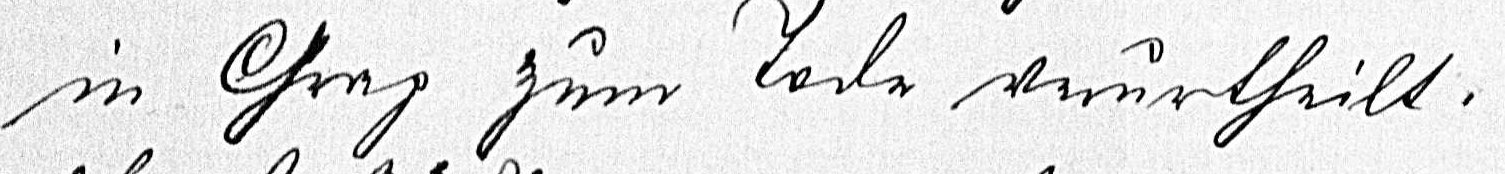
in Graz zum Tode verurtheilt.
